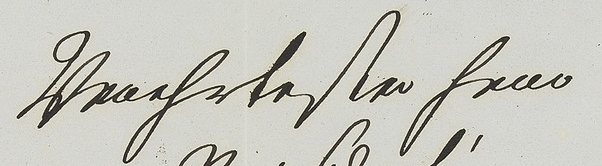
Verehrtester Herr
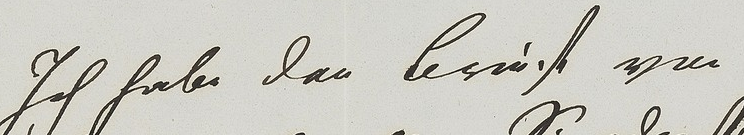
Ich habe den Brief von
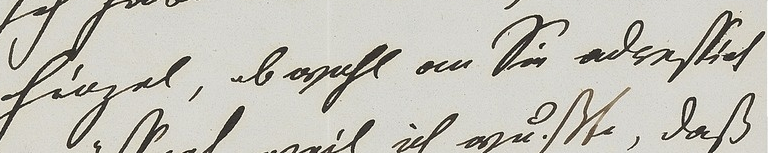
Hirzel, obwohl an Sie adressirt
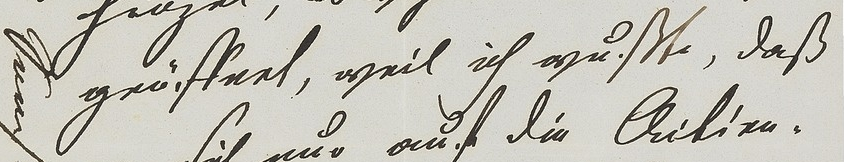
geöffnet, weil ich wußte, daß
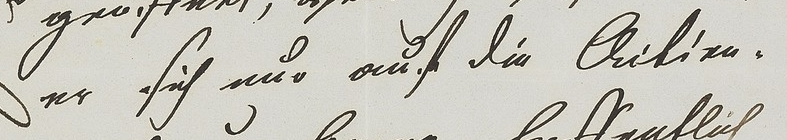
er sich nur auf die Actien-
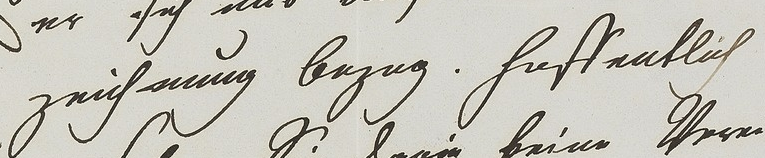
zeichnung bezog. Hoffentlich
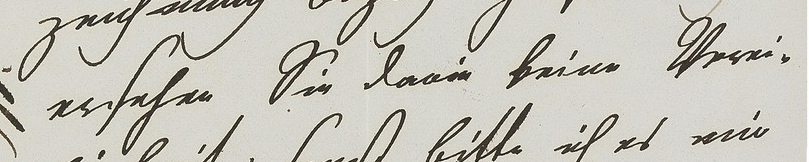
ersehen Sie darin keine Vorei-
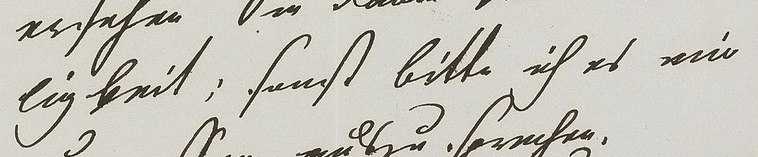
ligkeit; sonst bitte ich es mir
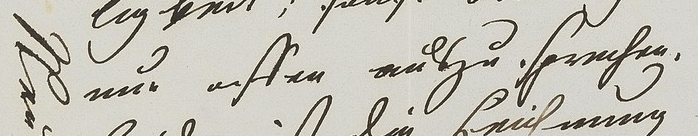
nur offen auszusprechen.
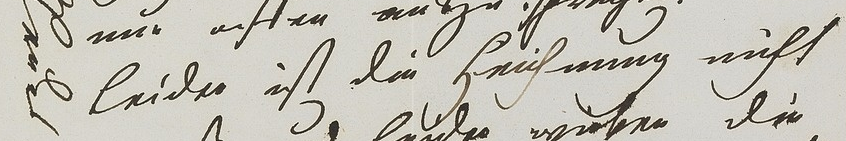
Leider ist die Zeichnung nicht
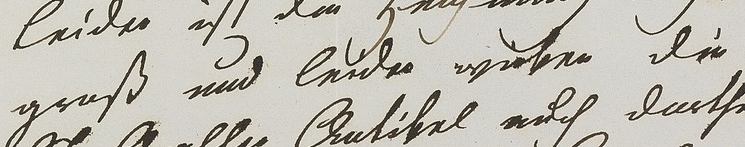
groß und leider wirken die
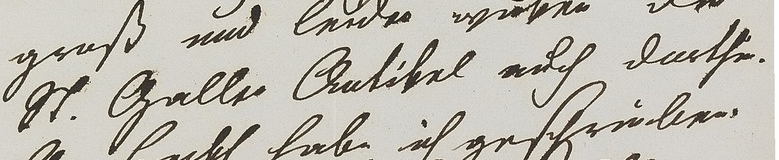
St. Galler Artikel auch dorthin.
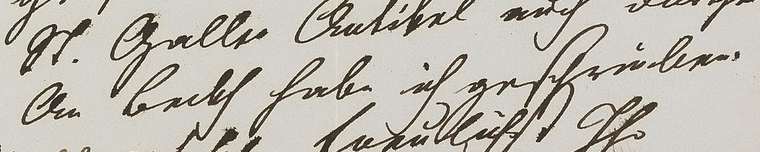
An Beckh habe ich geschrieben.
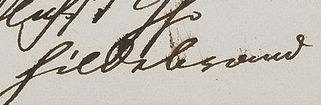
Hildebrand
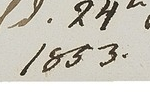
1853.
